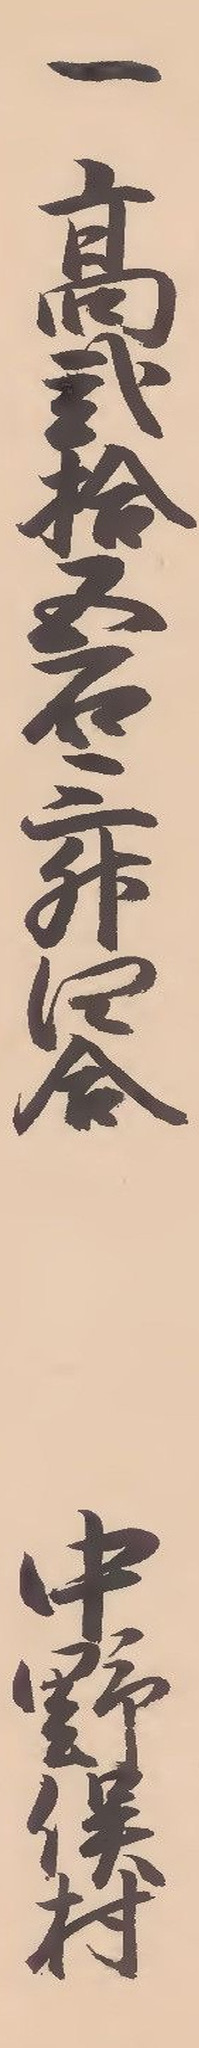一高弐拾五石三升四合中野俣村
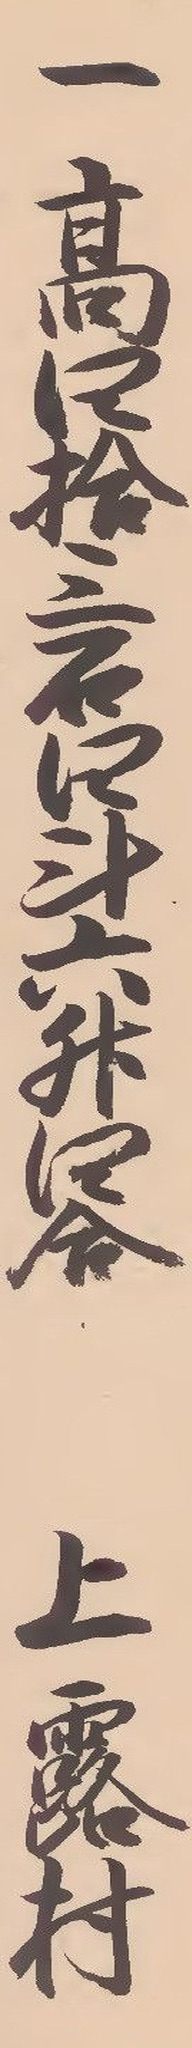一高四拾三石四斗六升四合上露村
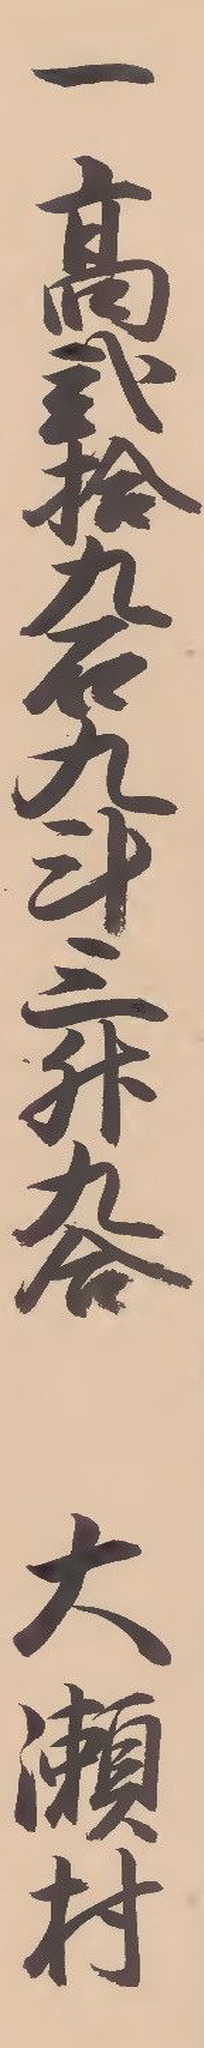一高弐拾九石九斗三升九合大瀬村
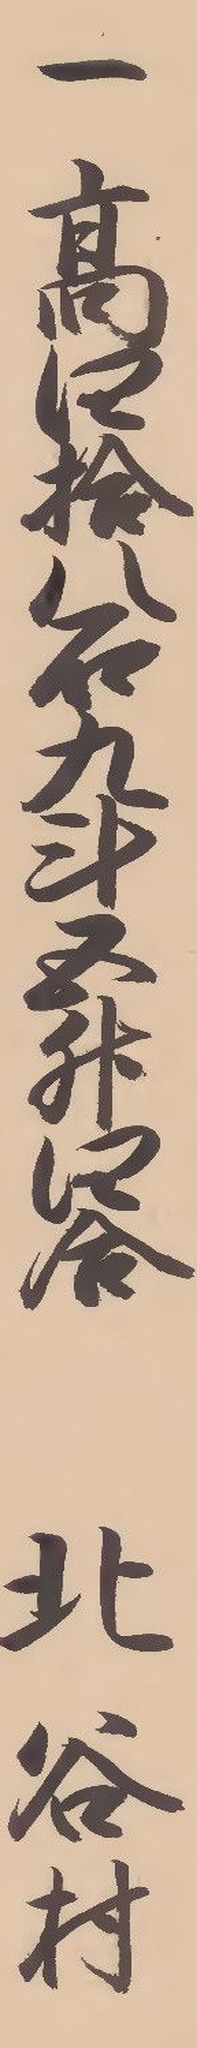一高四拾八石九斗五升四合北谷村
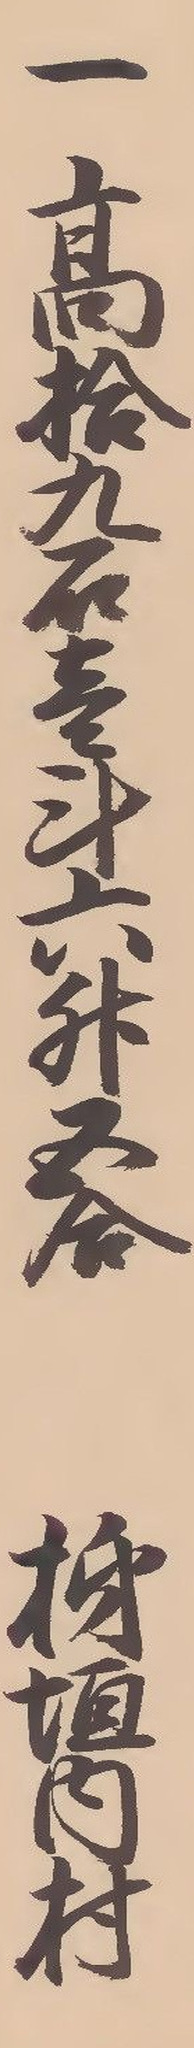一高拾九石壱斗六升五合柿垣内村

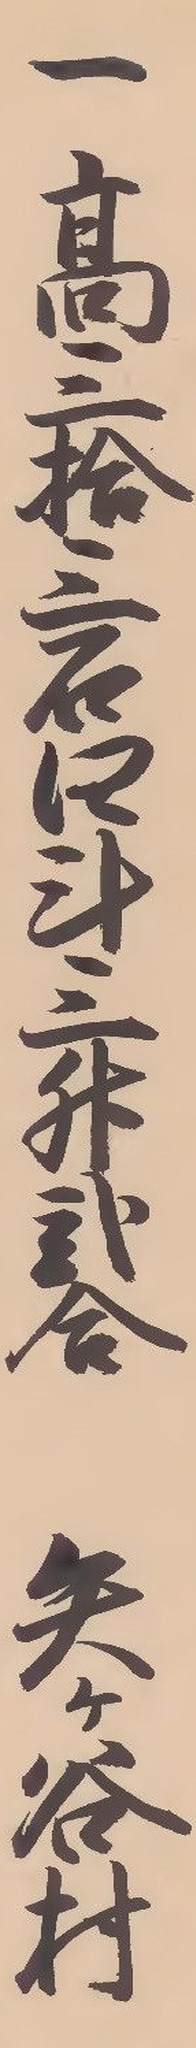一高三拾三石四斗三升弐合矢ヶ谷村
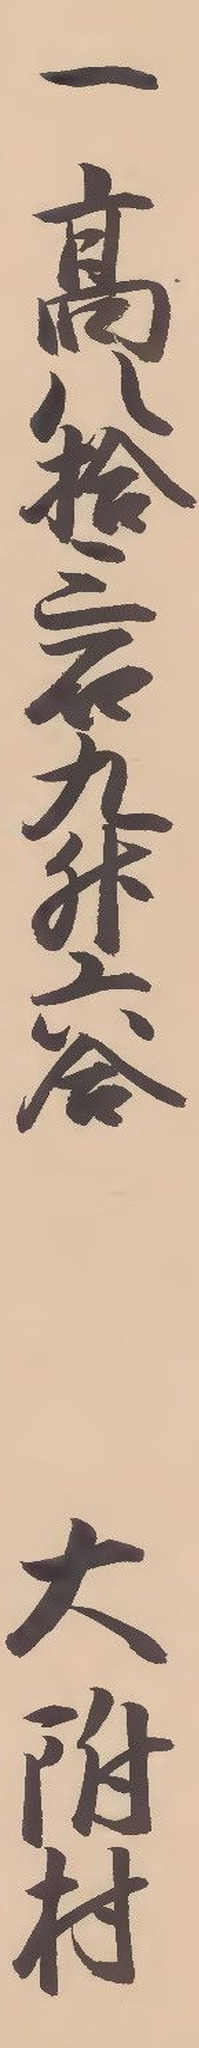一高八拾三石九升六合大附村
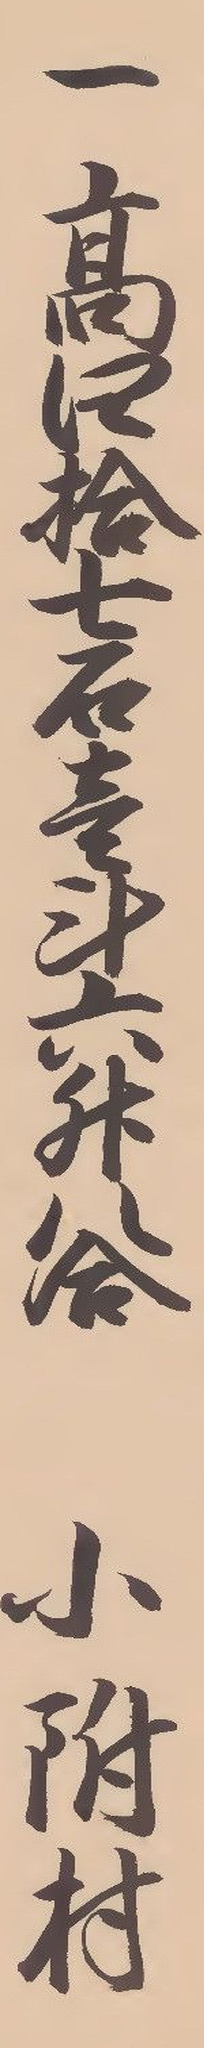一高四拾七石壱斗六升八合小附村
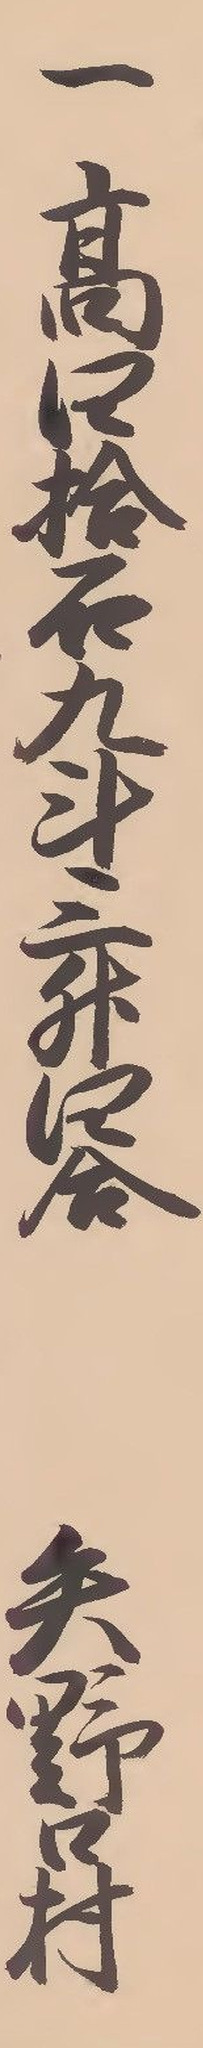一高四拾石九斗三升四合矢野口村
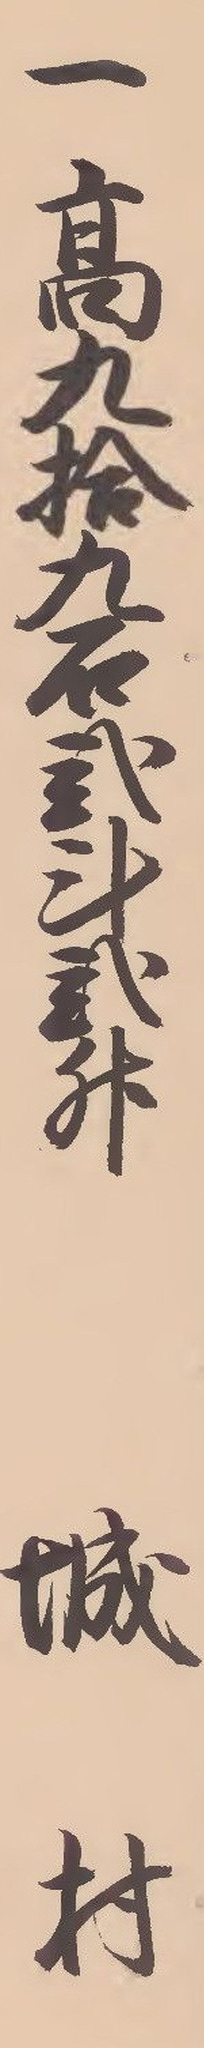一高九拾九石弐斗弐升城村
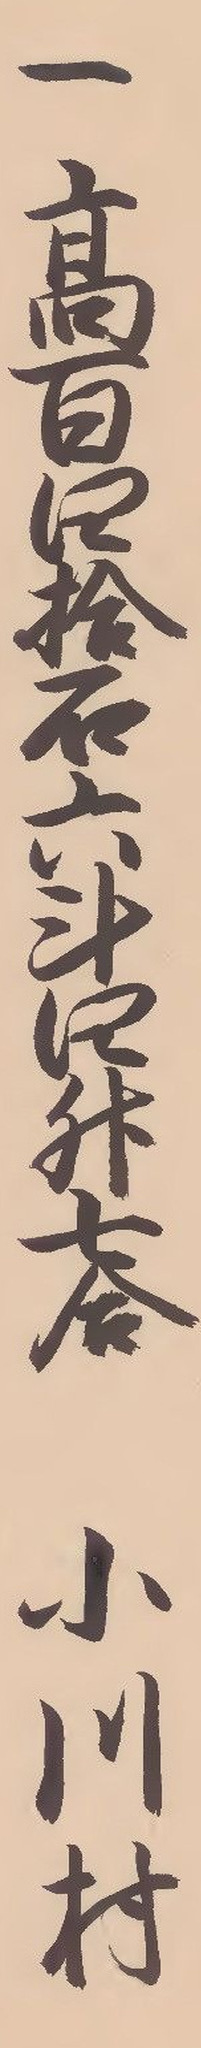一高百四拾石六斗四升七合小川村
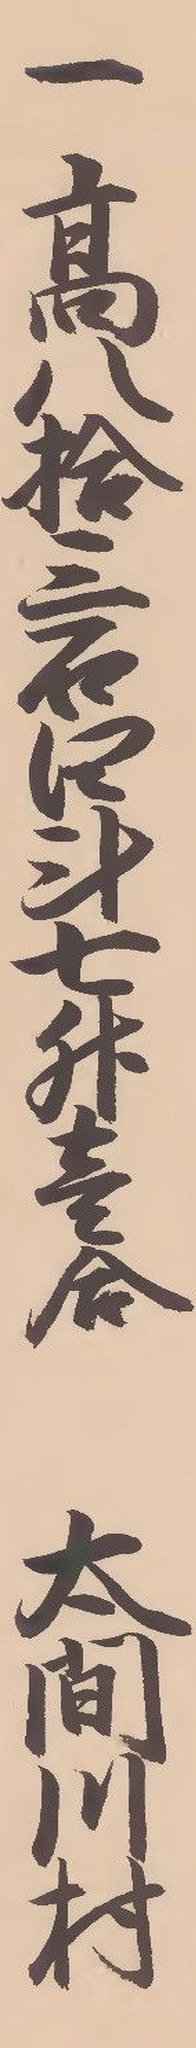一高八拾三石四斗七升壱合太間川村

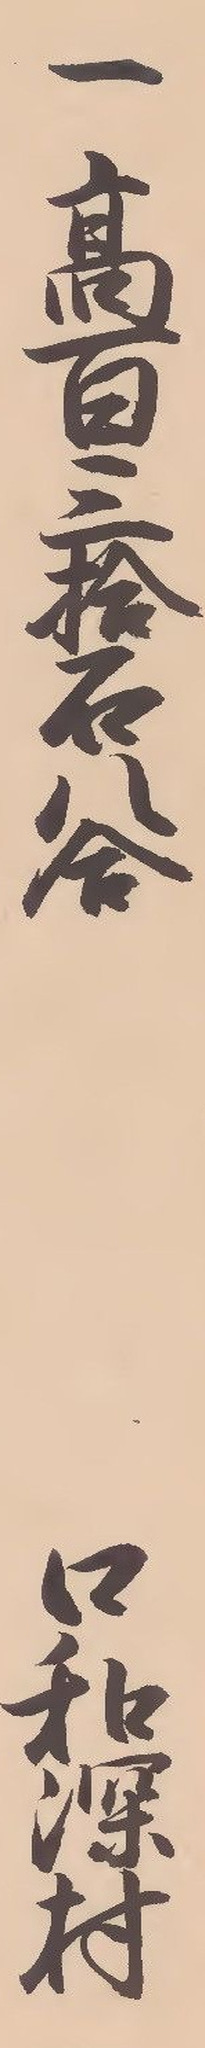一高百三拾石八合口和深村
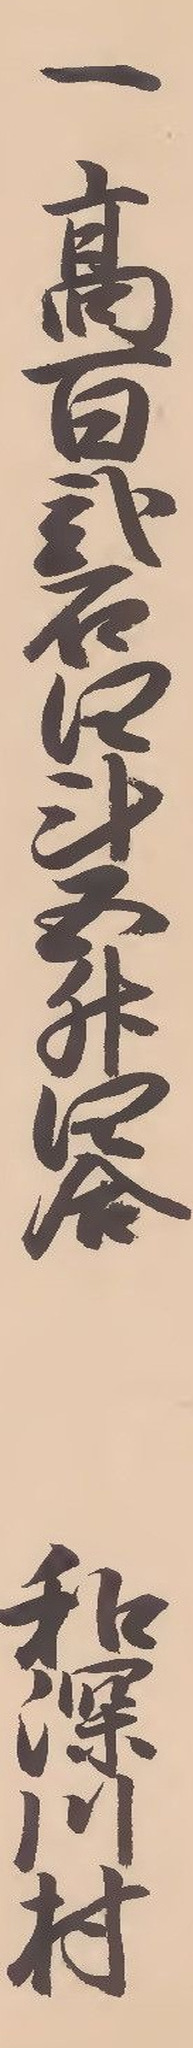一高百弐石四斗五升四合和深川村
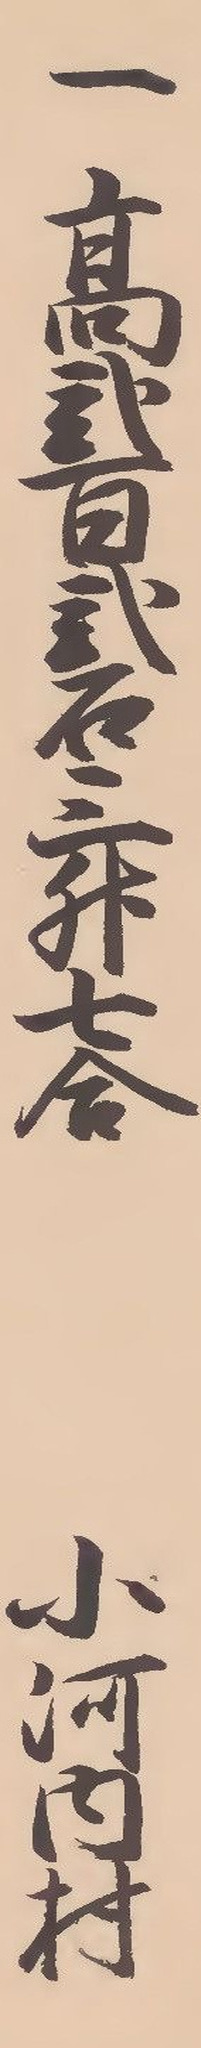一高弐百弐石三升七合小河内村
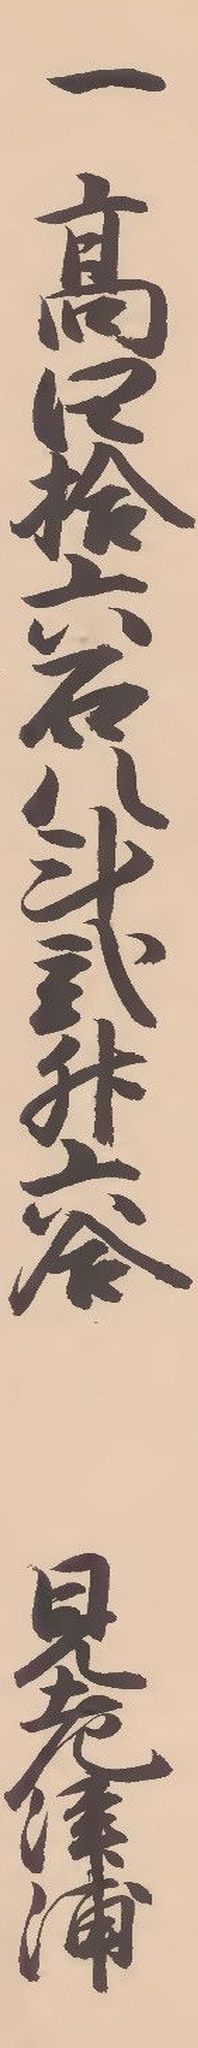一高四拾六石八斗弐升六合見老津浦
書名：紀伊国郷帳
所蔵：国立公文書館 National Archives of Japan
